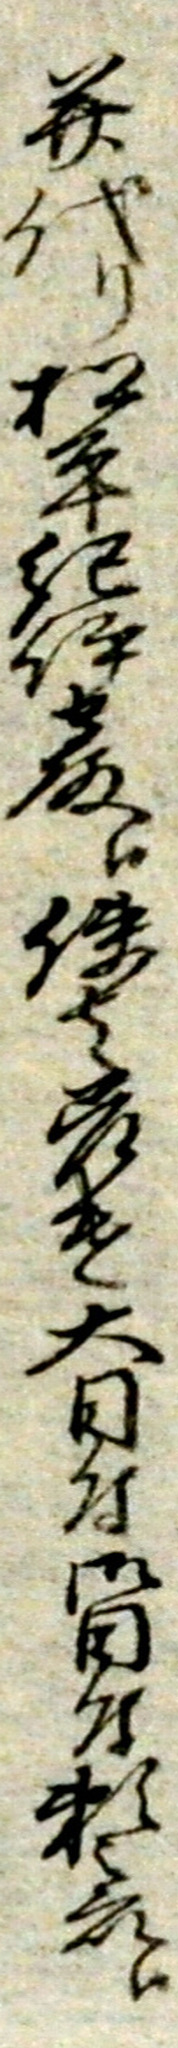幷代り松平紀伊守殿江使者差遣大目付御目付頼之衆江
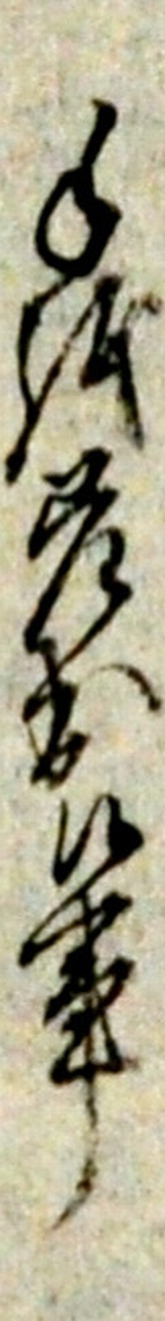手紙差出候事
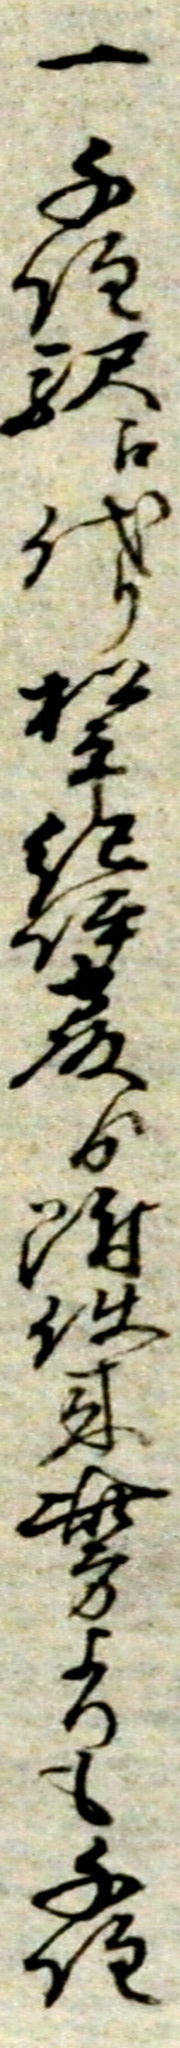一千住駅江代り松平紀伊守殿ゟ附使来此方よりも千住
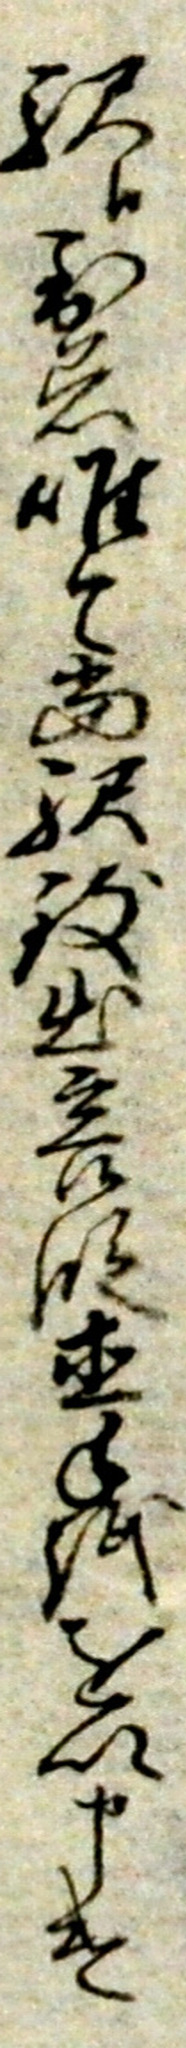駅江到着唯今当駅致出立候段直手紙を以申遣
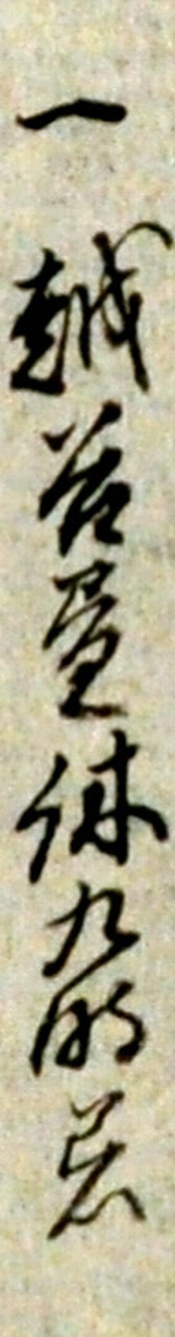一越谷昼休九時着
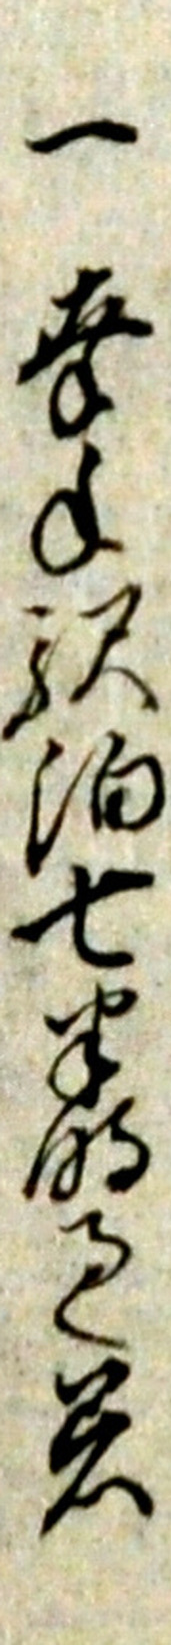一幸手駅泊七半時過着
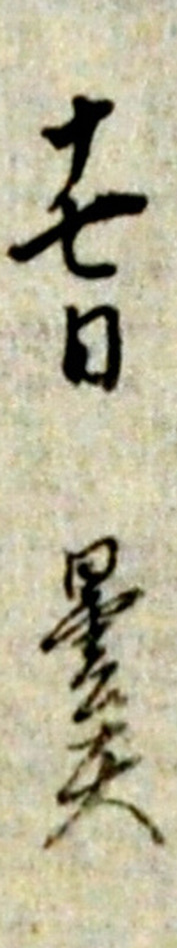十七日曇天
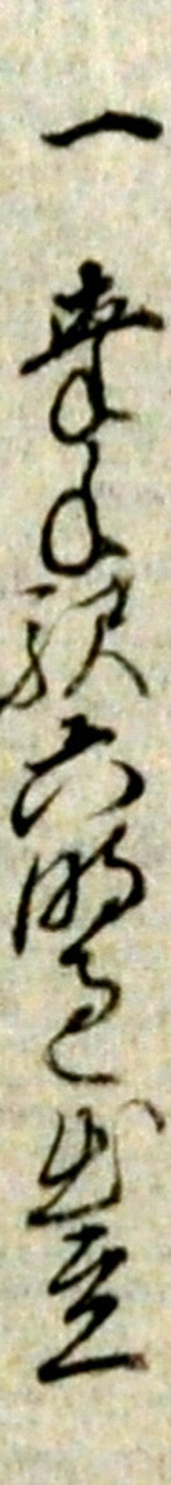一幸手駅六時過出立
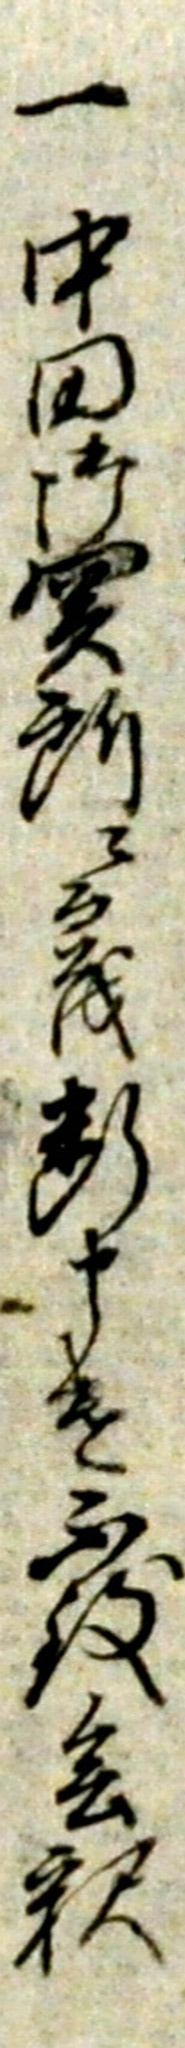一中田御関所ニ而も断申遣不致会釈
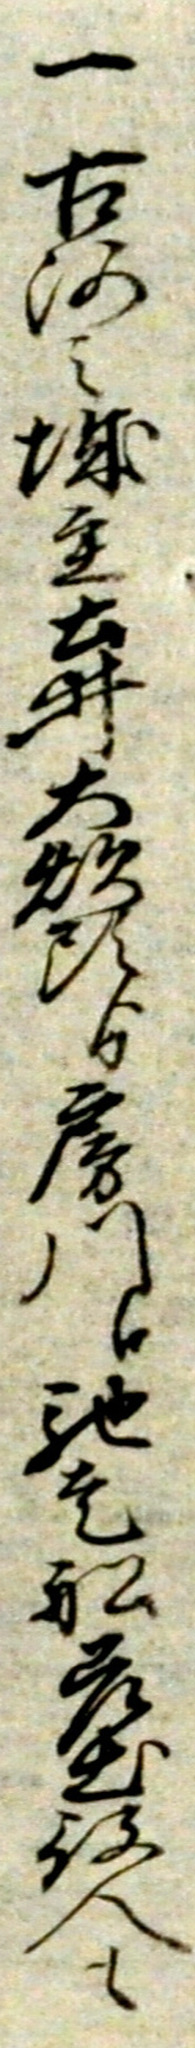一古河之城主土井大炊頭ゟ房川え馳走船差出役人も
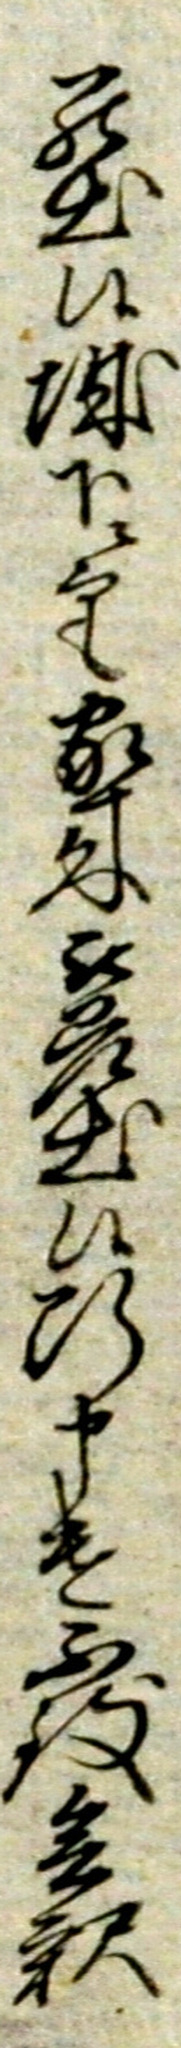罷出候城下ニ而も家来被差出候断申遣不致会釈
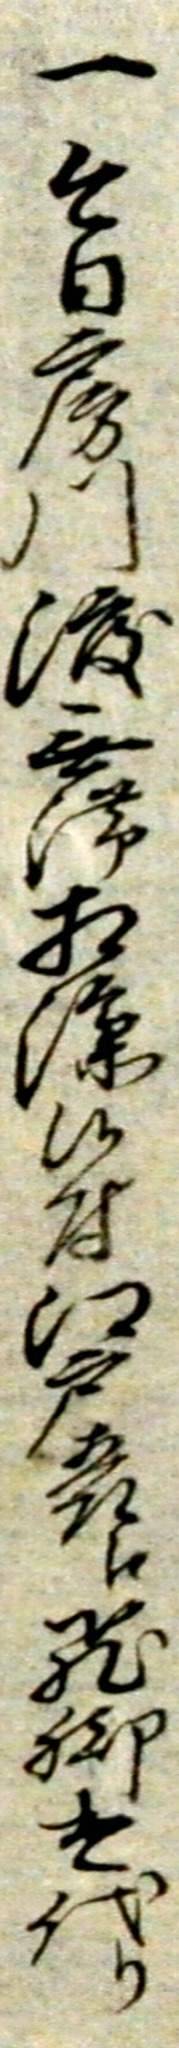一今日房川渡無滞相済候付江戸表江飛脚遣代ㇼ
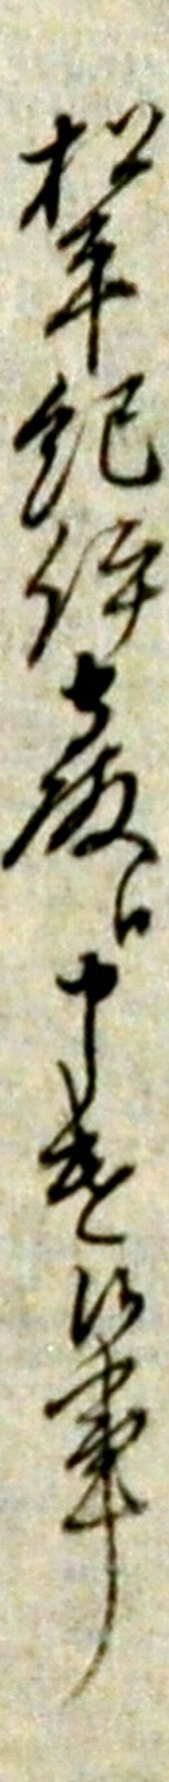松平紀伊守殿江申遣候事
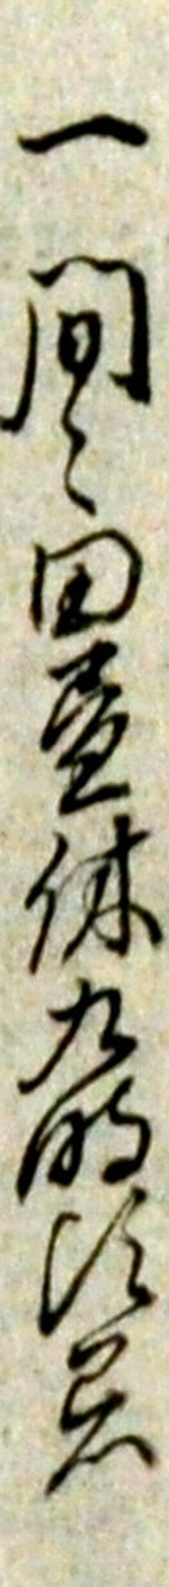一間々田昼休九時頃着
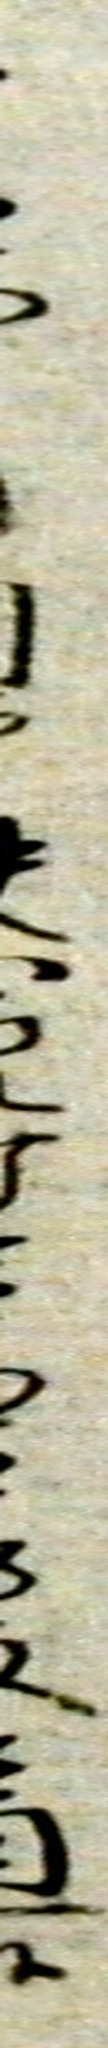一右休之内例幣使正親町宰相中将殿被通候

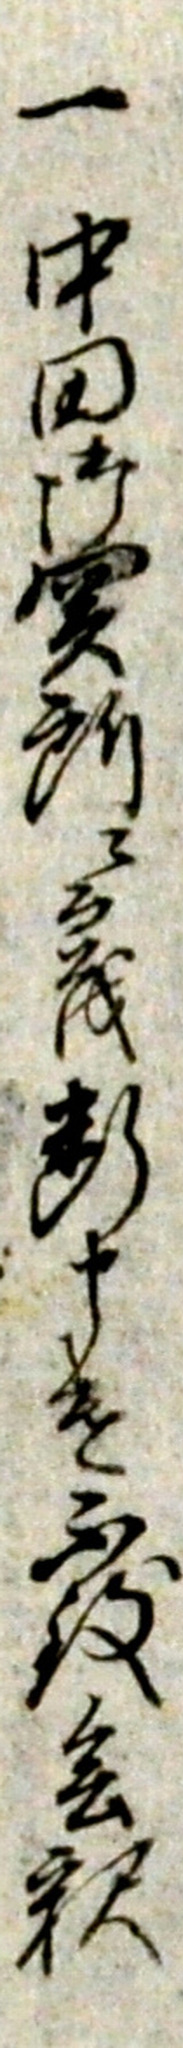一中田御関所ニ而茂断申遣不致会釈
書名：日光御名代相勤候節ノ留
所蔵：伊那市立高遠町図書館・合同会社AMANE
